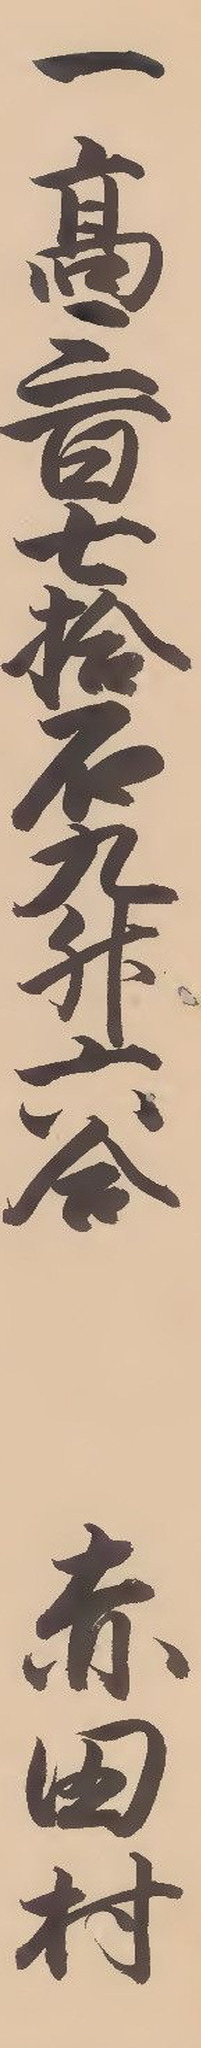一高三百七拾石九升六合赤田村
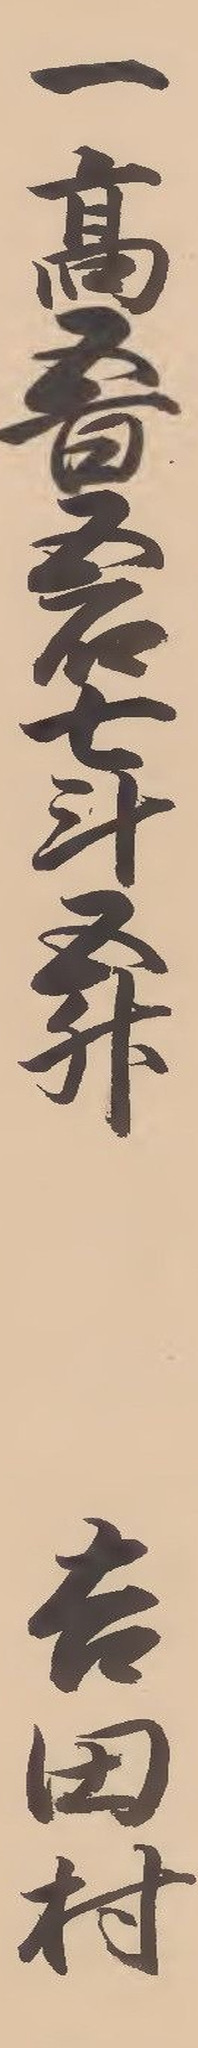一高五百五石七斗五升吉田村
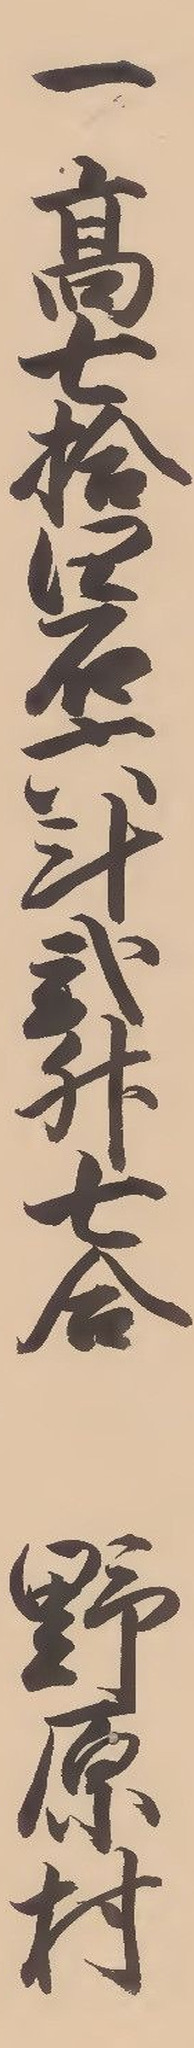一高七拾四石六斗弐升七合野原村
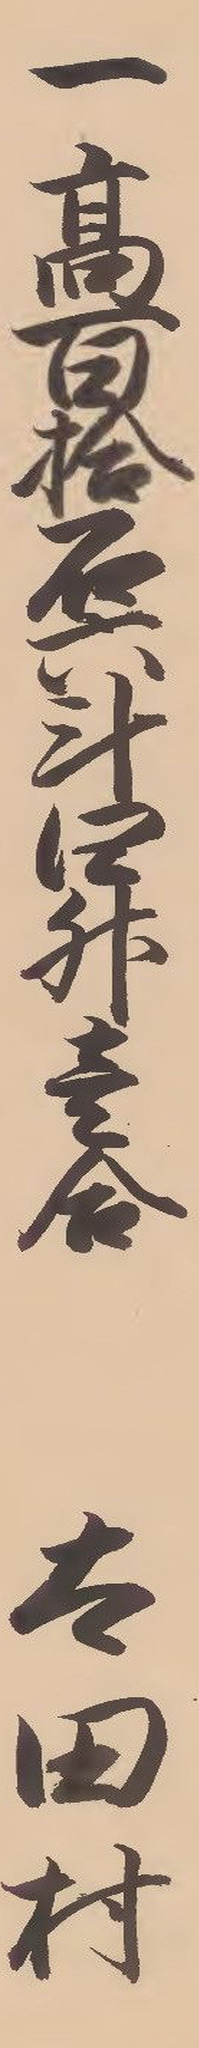一高百拾石六斗四升壱合太田村
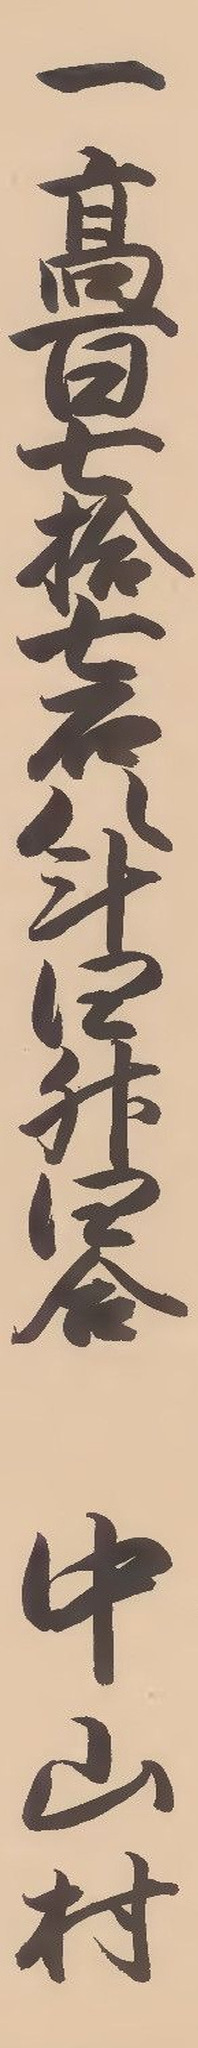一高百七拾七石八斗四升四合中山村
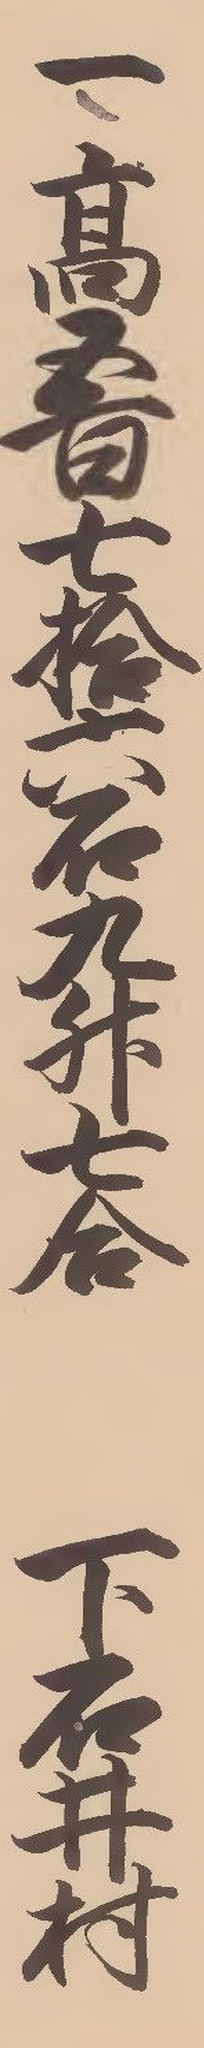一高五百七拾六石九升七合下石井村
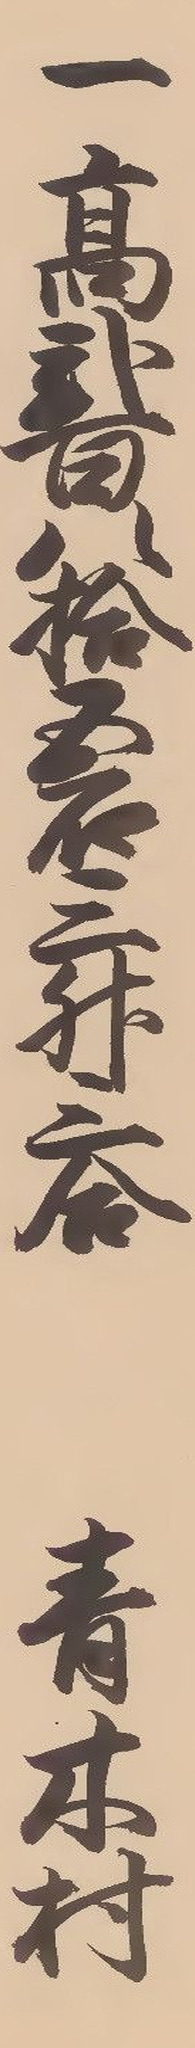一高弐百八拾五石三升三合青木村
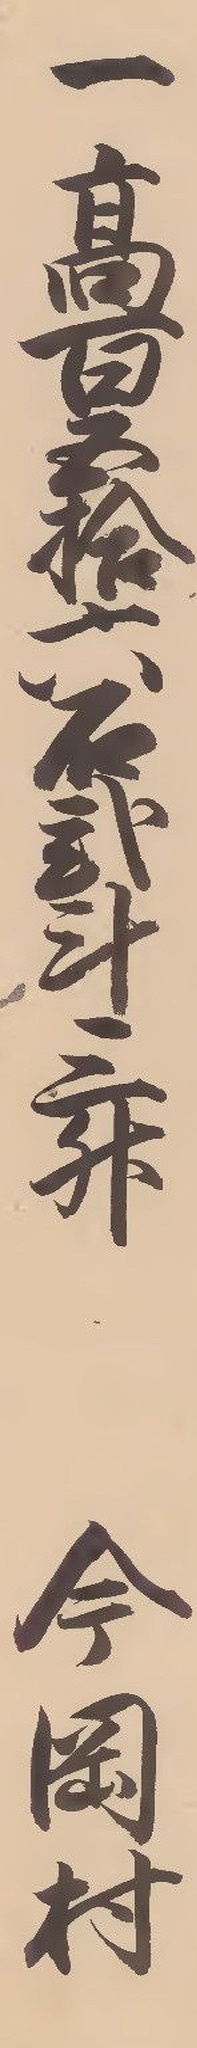一高百五拾六石弐斗三升今岡村

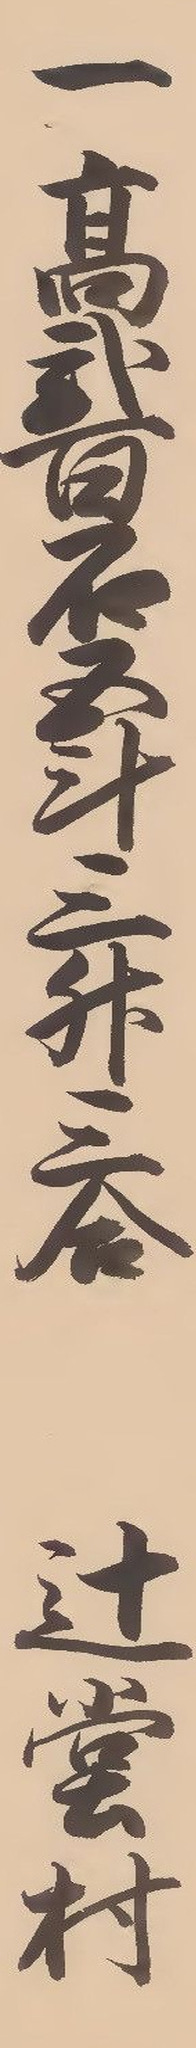一高弐百石五斗三升三合辻堂村
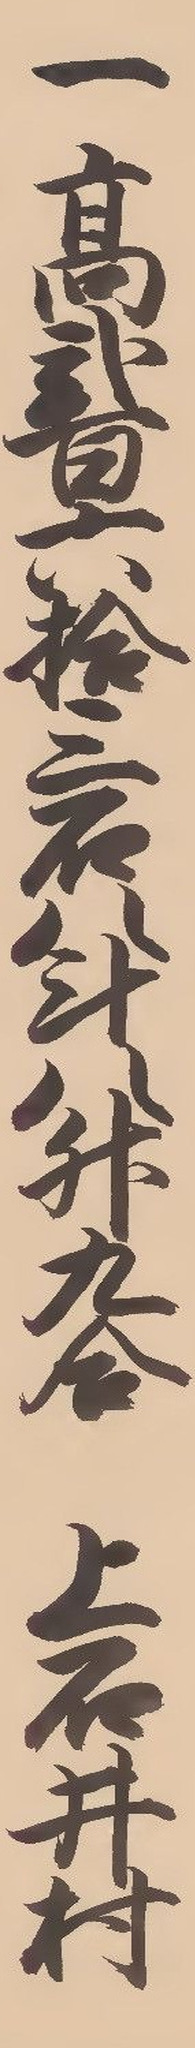一高弐百六拾三石八斗八升九合上石井村
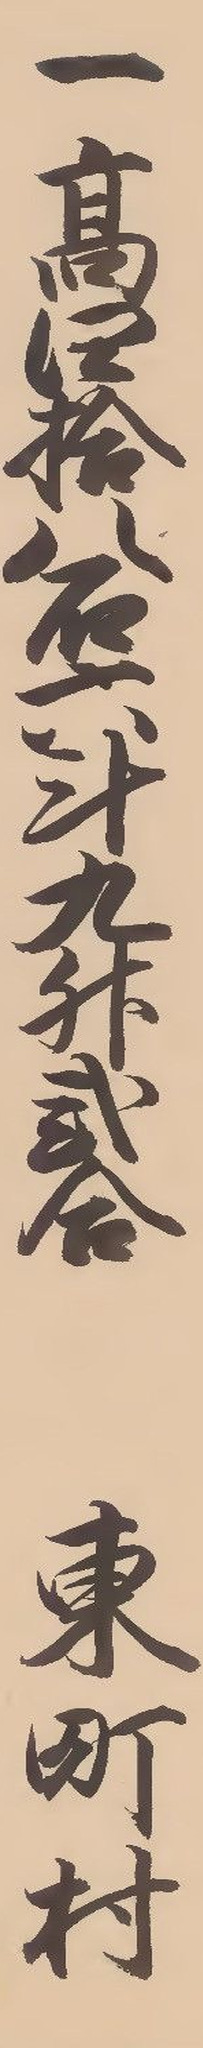一高四拾八石六斗九升弐合東町村
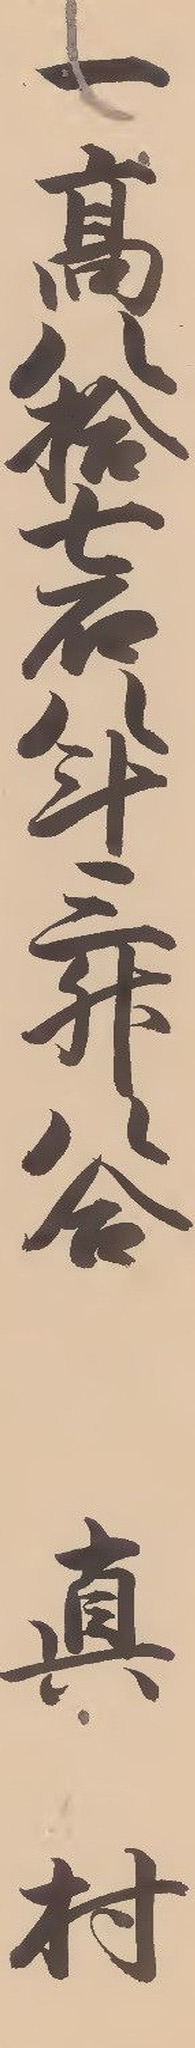一高八拾七石八斗三升八合真村
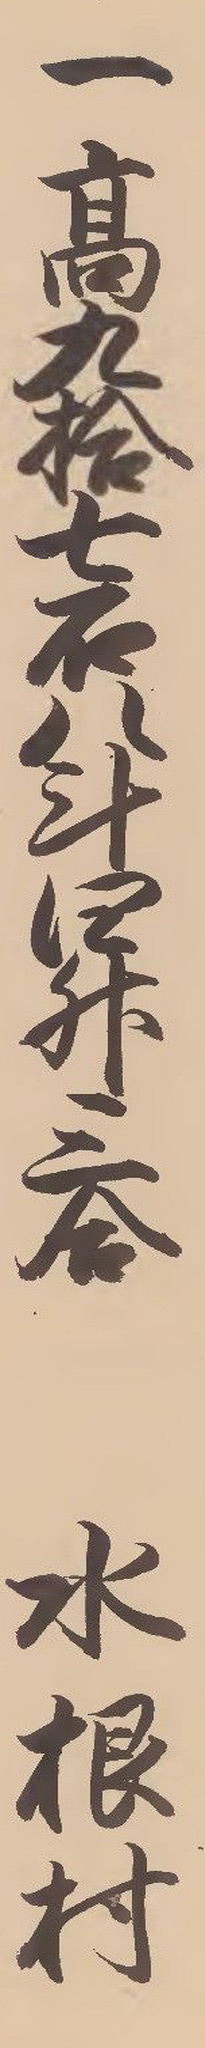一高九拾七石八斗四升三合水根村
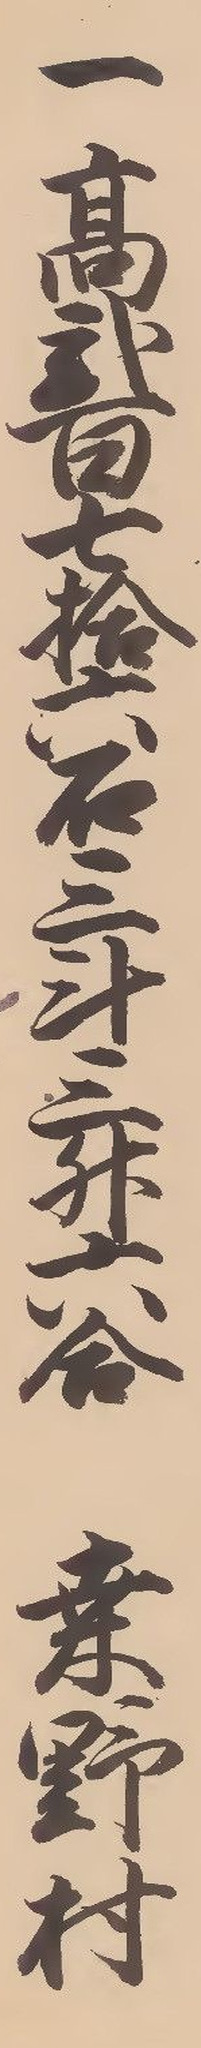一高弐百七拾六石三斗三升六合桑野村

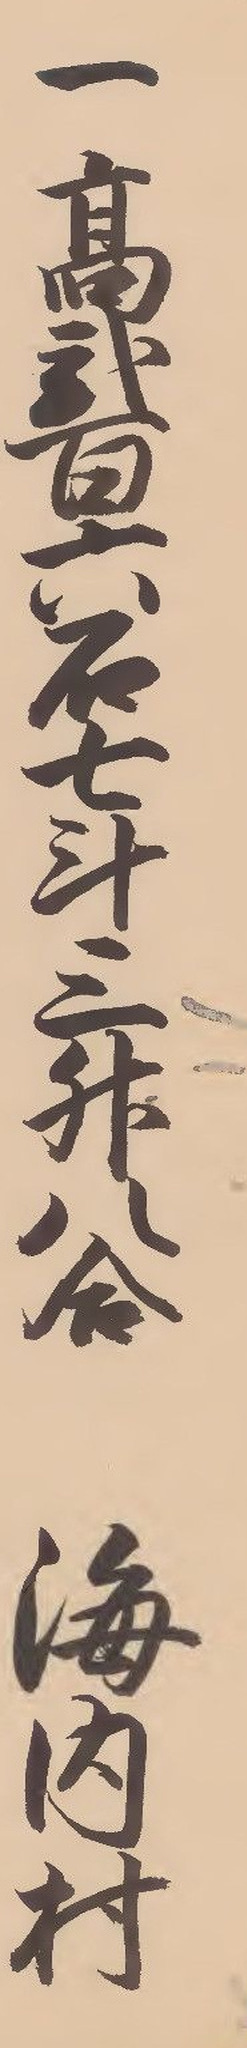一高弐百六石七斗三升八合海内村
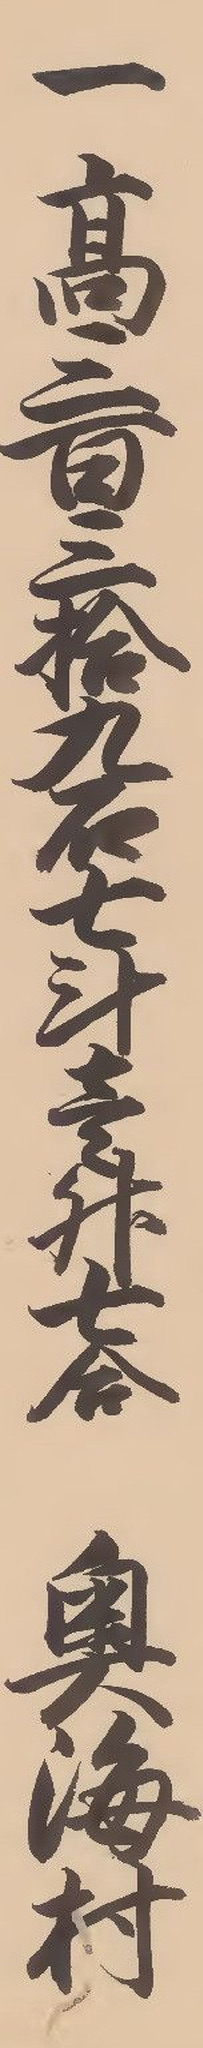一高三百三拾九石七斗壱升七合奥海村
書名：美作国郷帳
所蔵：国立公文書館 National Archives of Japan
